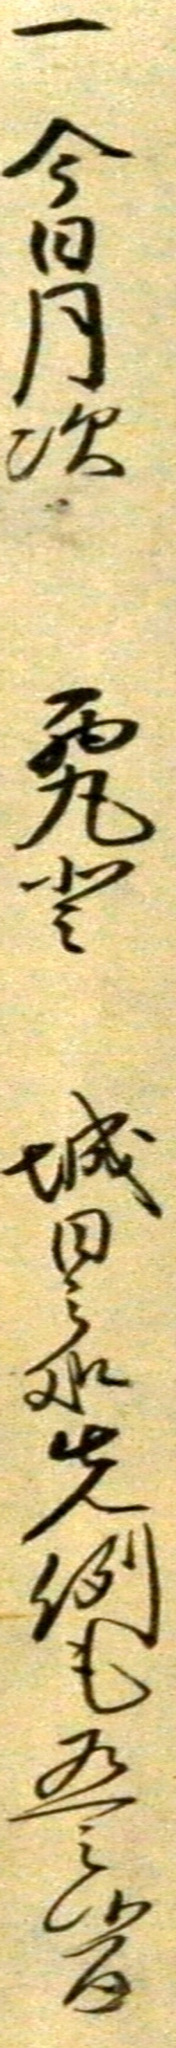一今日月次西丸登城日之処先例も有之候間
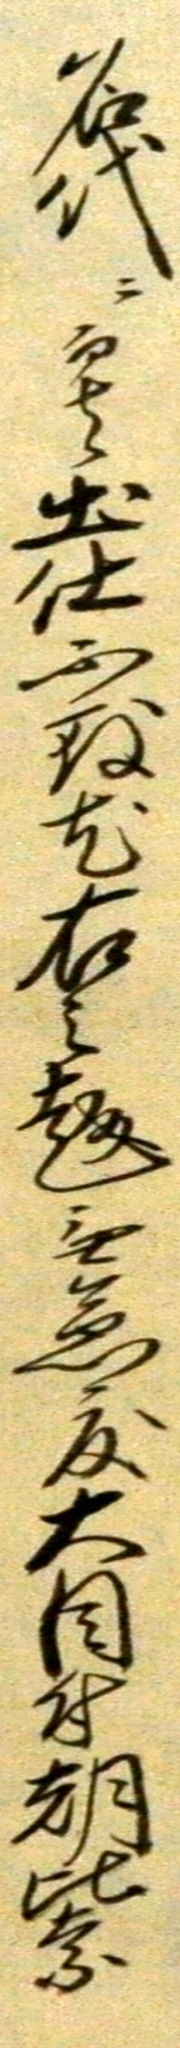名代ニ而は出仕不致尤右之趣無急度大目付朝比奈
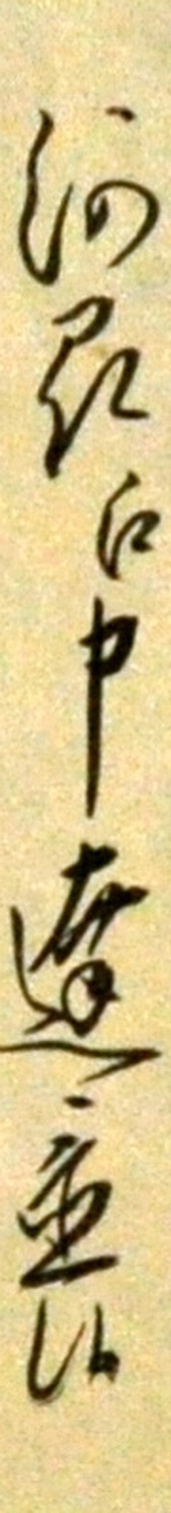河州え申達置候

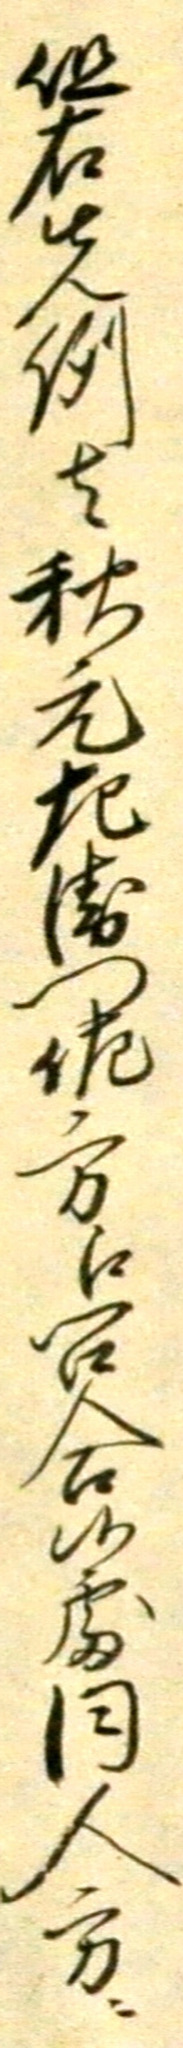但右先例は秋元左衛門佐方え問合候處同人方ニ
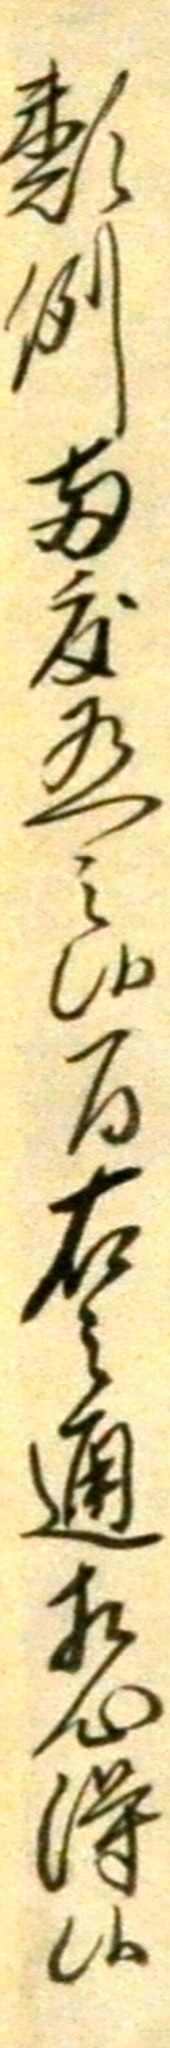類例両度有之候間右之通相心得候
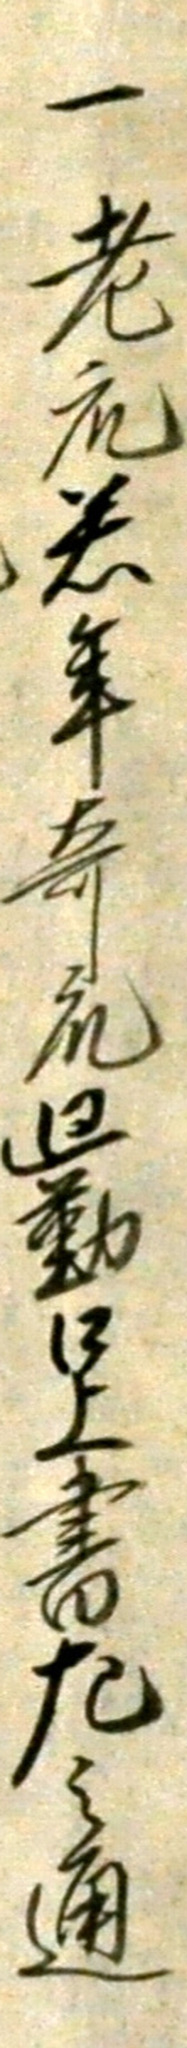一老衆若年寄衆廻勤口上書左之通
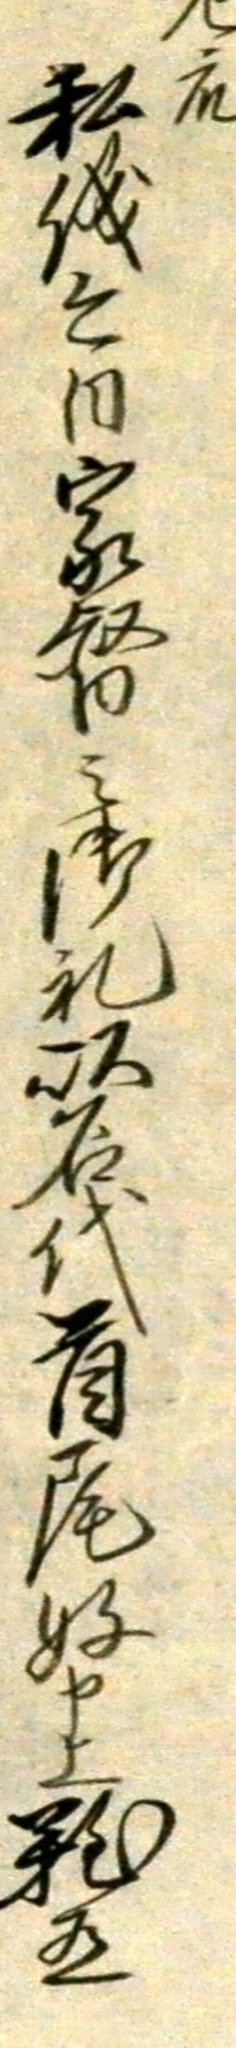私儀今日家督之御礼以名代首尾好申上難有
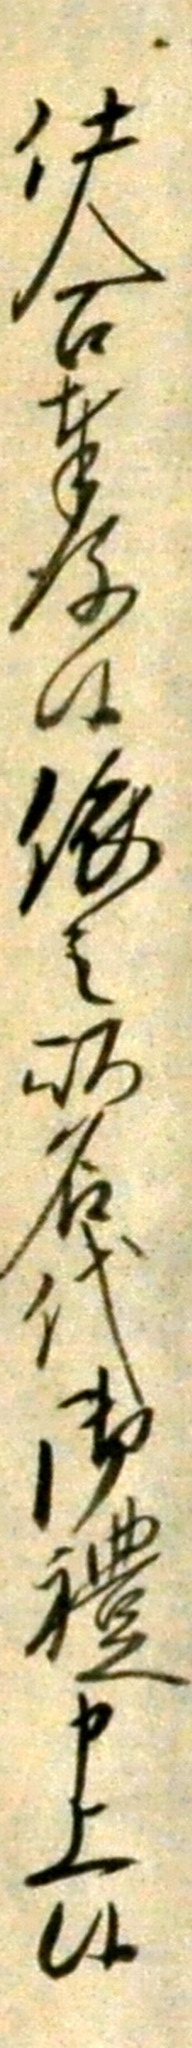仕合奉存候依之以名代御礼申上候
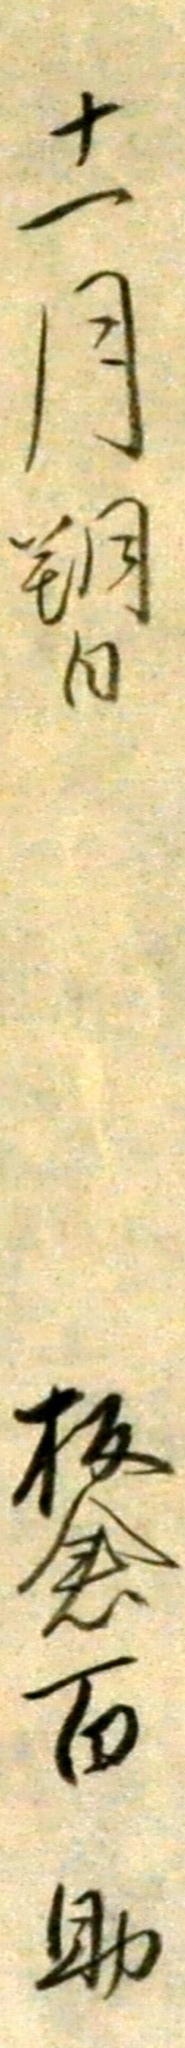十一月朔日板倉百助
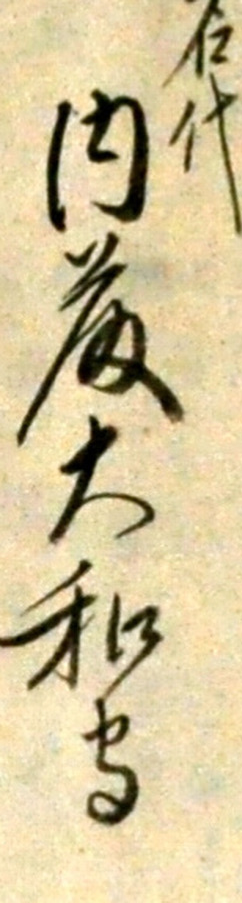内藤大和守
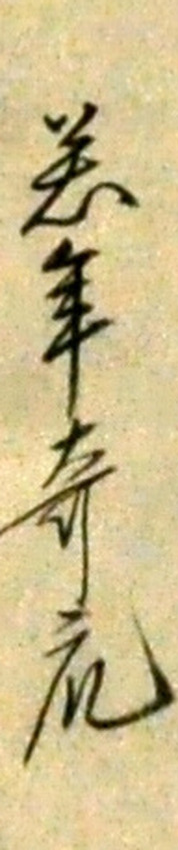若年寄衆
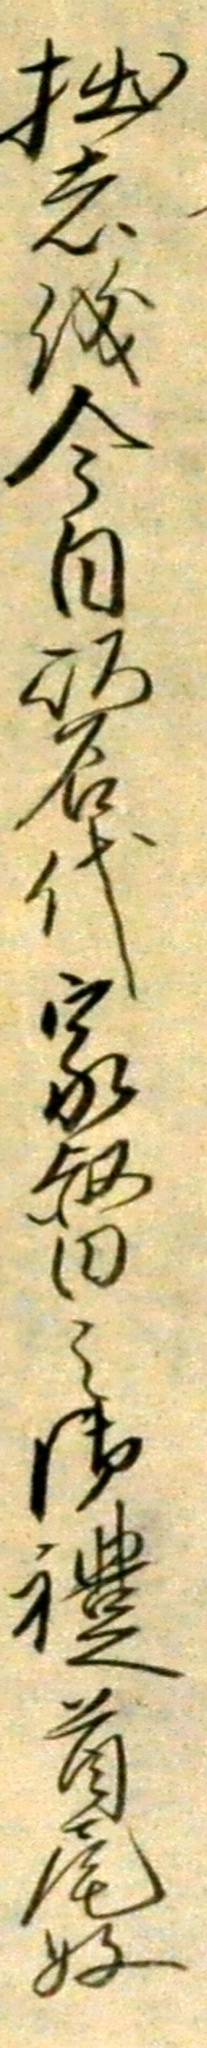拙者儀今日以名代家督之御礼首尾好
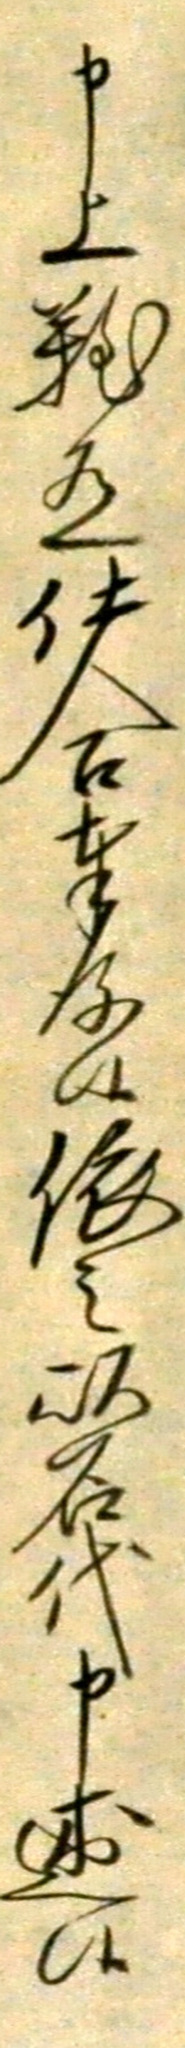申上難有仕合奉存候依之以名代申述候
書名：諸名代相勤候節ノ留書外
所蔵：伊那市立高遠町図書館・合同会社AMANE
